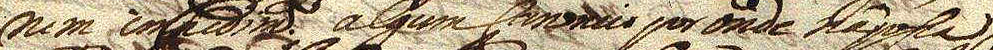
nem empedim.to algum Canonico por onde nā possa
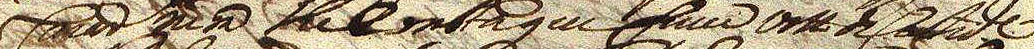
Cazar nem lhe Consta que fizece votto de Castid.e
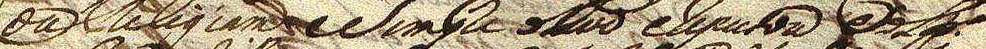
ou Religiam e Sempre o teve e Reputou Soltr.o
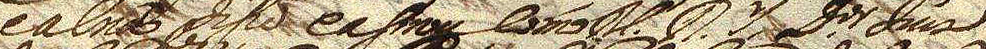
e al naõ disse e assinou com o M. R. S. D.or Juiz
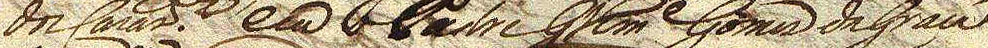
doz Cazam.tos e eu o Padre Glhm.e Gomez da Graça
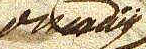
o escrevy
